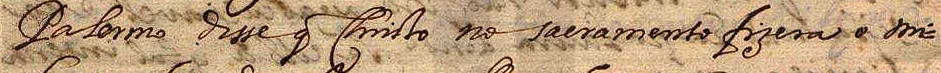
Palermo disse q̄ Christo no sacramento fizera o mi
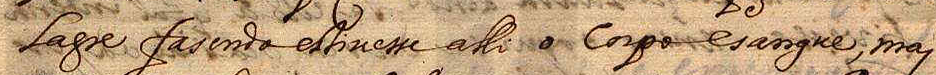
lagre fasendo estiuesse alli o corpo e sangue, mas
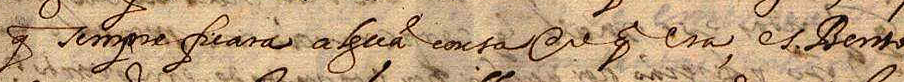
q̄ sempre ficara alguā cousa do q̄ era e s. Bento
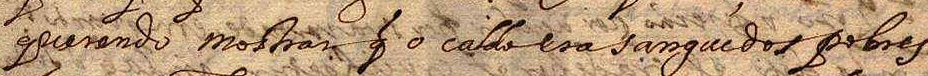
querendo mostrar q̄ o caldo era sangue dos pobres
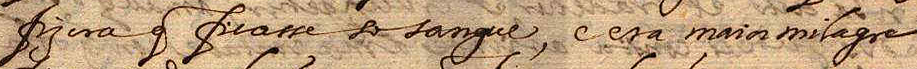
fizera q̄ ficasse so sangue, e era maior milagre
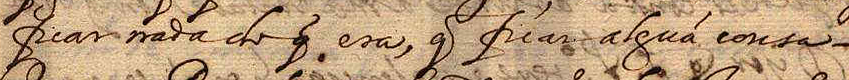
ficar nada do q̄ era, q̄ ficar alguā cousa -
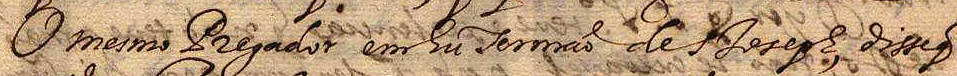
O mesmo Pregador em hū sermaõ de s Ioseph disse q̄
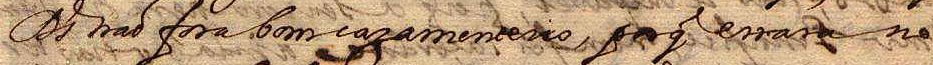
Ds̄ naõ fora bom cazamenteiro, porq̄ errara no
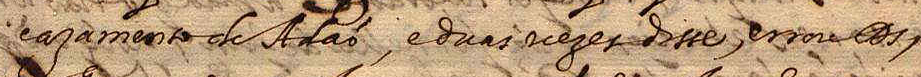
cazamento de Adaõ, e duas uezes disse, errou Ds,
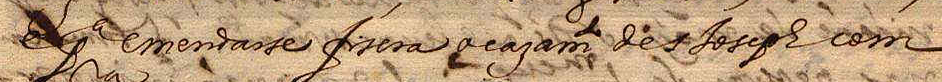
e pa emendarse fisera o cazamto de s Ioseph com
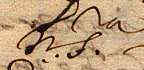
n. S.ra
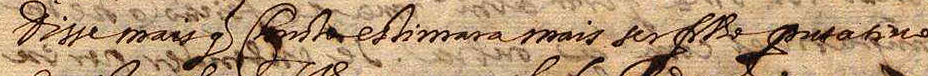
Disse mais q̄ Christo estimara mais ser filho putatiuo
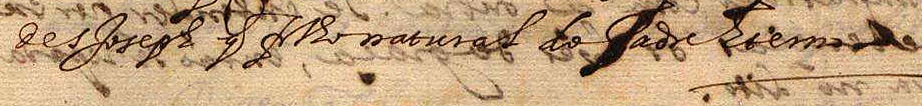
de s Joseph q̄ filho natural do Padre Eterno
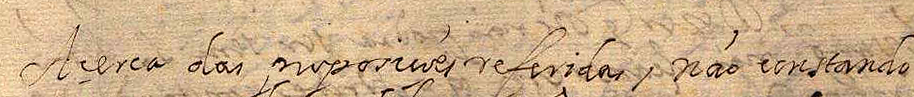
Acerca das proposiçoẽs referidas, naõ constando
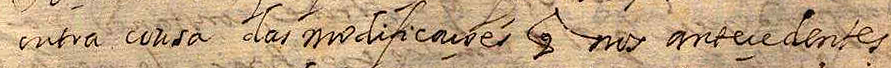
outra cousa das modificaçoẽs q̄ nos antecedentes
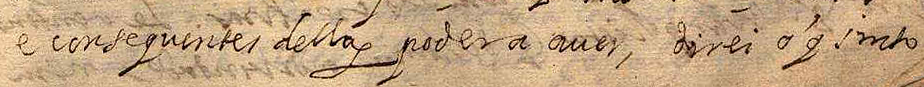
e consequentes dellas podera auer, direi o q̄ sinto
